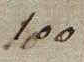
100
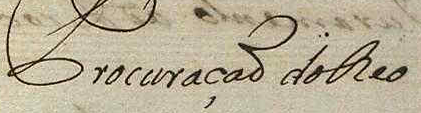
Procuração do Reo
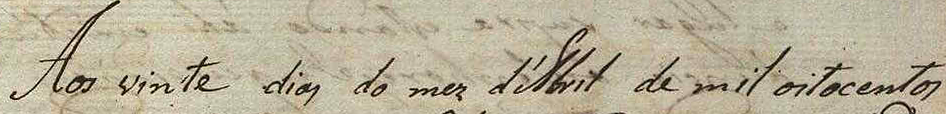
Aos vinte dias do mez d'Abril de mil oitocentos
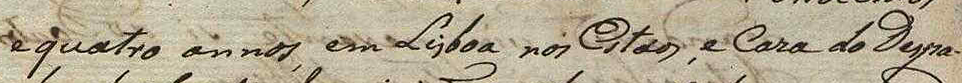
e quatro annos em Lisboa nos Estaos, e Caza do Despa
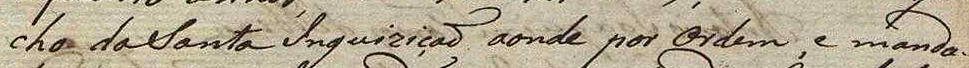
cho da Santa Inquiziçaõ aonde por Ordem, e manda
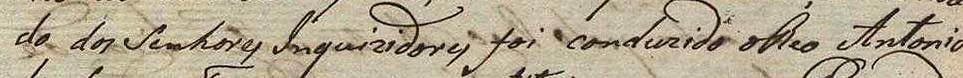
do dos Senhores Inquizidores foi conduzido o Reo Antonio
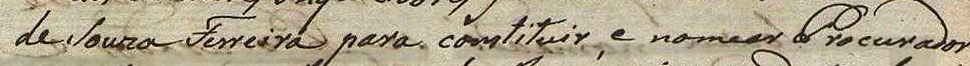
de souza Ferreira para constituir, e nomear Procurador
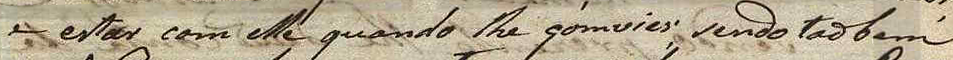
e estar com elle quando lhe comvier, sendo taõbem
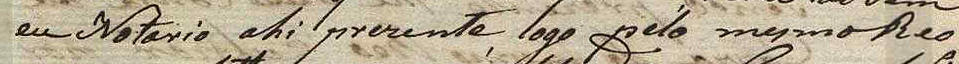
eu Notario ahi prezente, logo pelo mesmo Reo
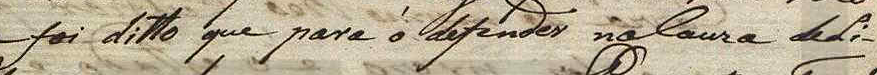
foi ditto que para o defender na Cauza de Li
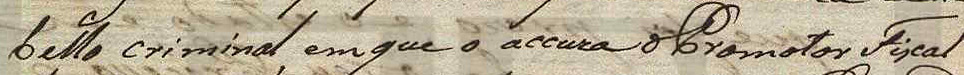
bello criminal, em que o accuza o Promotor Fiscal
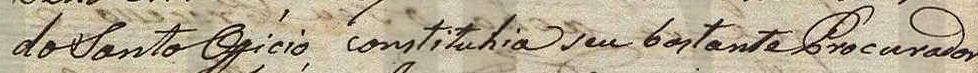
do Santo Oficio, constituhia seu bastante Procurador
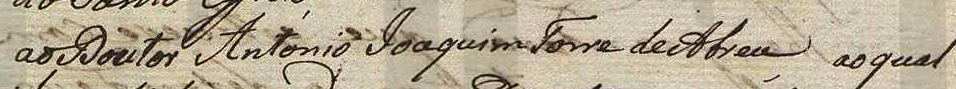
ao Doutor Antonio Ioaquim Torre de Abreu, ao qual
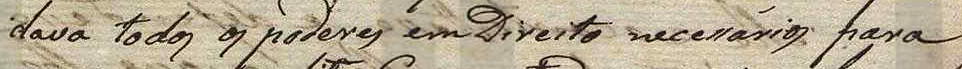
dava todos os poderes em Direito necessarios para
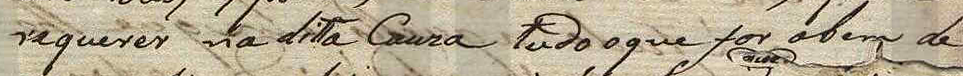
requerer na dita Cauza tudo o que for a bem de
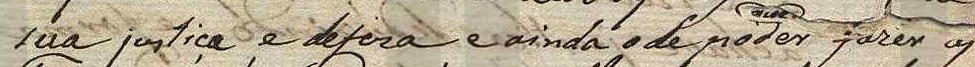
sua justiça, e defeza, e ainda o de poder fazer as
